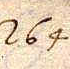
264
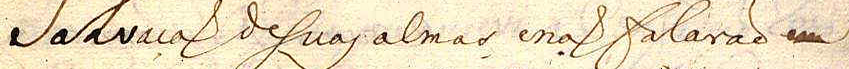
salvaçaõ de suas almas, e naõ falaraõ em
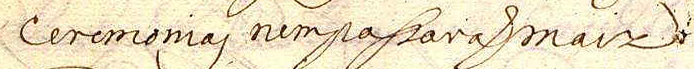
ceremonias nem passaraõ maiz
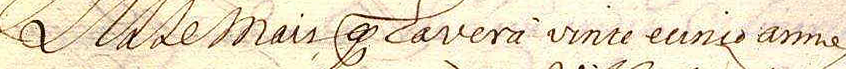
Disse mais, q̄ havera vinte e cinco annos
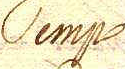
Tempo
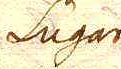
Lugar
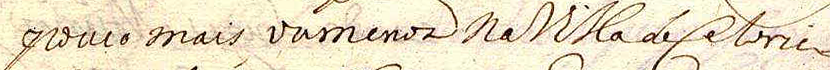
pouco mais, ou menoz na Villa de Celorico
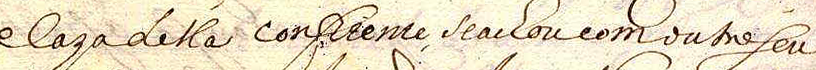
e Caza della confitente, se achou com outro seu
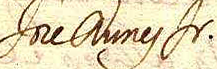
Joze Nunes Jr.
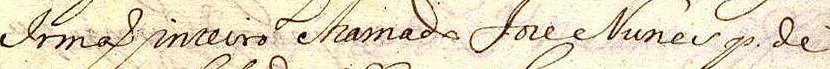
Irmaõ inteiro chamado Joze Nunes p. de
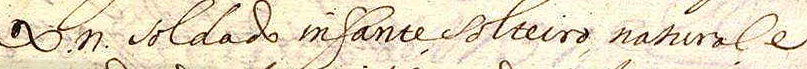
x. n. soldado infante, solteiro, natural, e
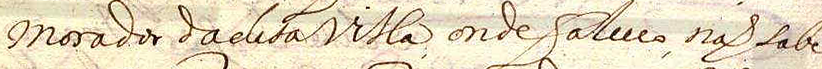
morador da dita villa onde faleceo, naõ sabe
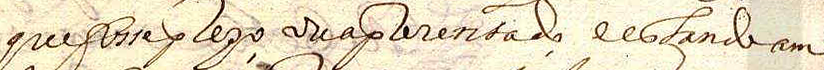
que fosse pRezo, ou apRezentado, e estando am
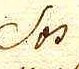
sos
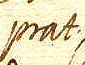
prat.
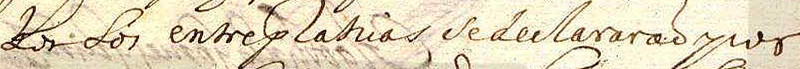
bos sós entre pRaticas se declararaõ por
